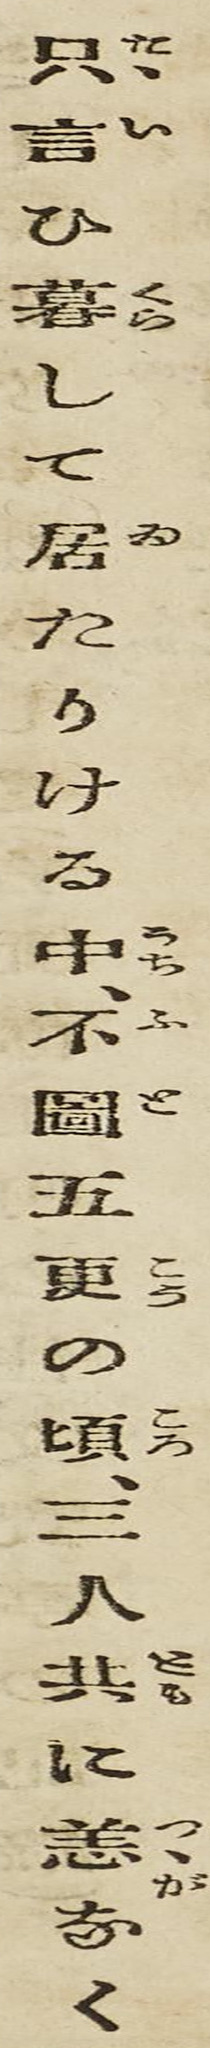只言ひ暮して居たりける中、不図五更の頃、三人共に恙なく
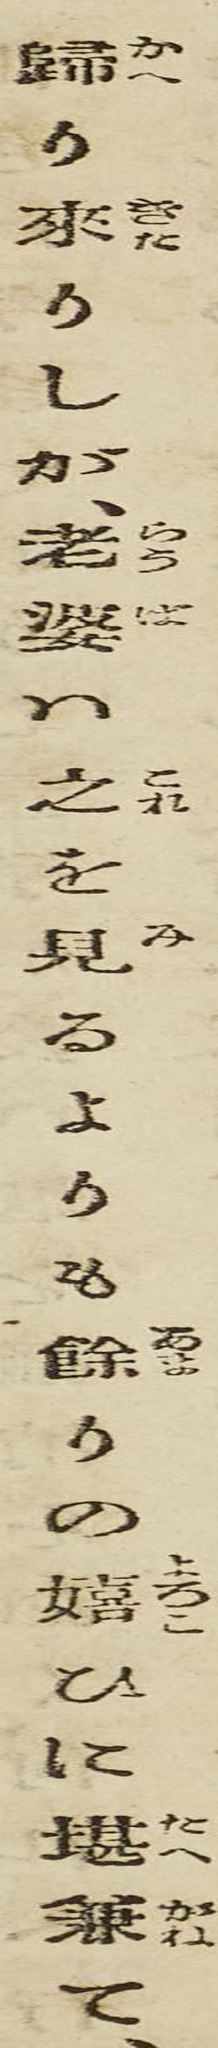帰り来りしが、老婆は之を見るよりも余りの嬉ひに耐兼て、
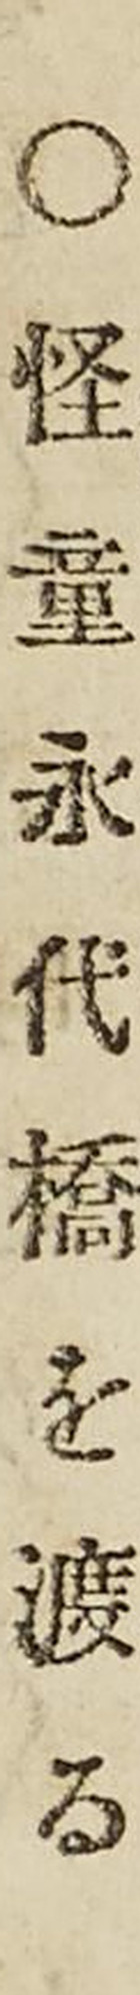○怪童永代橋を渡る
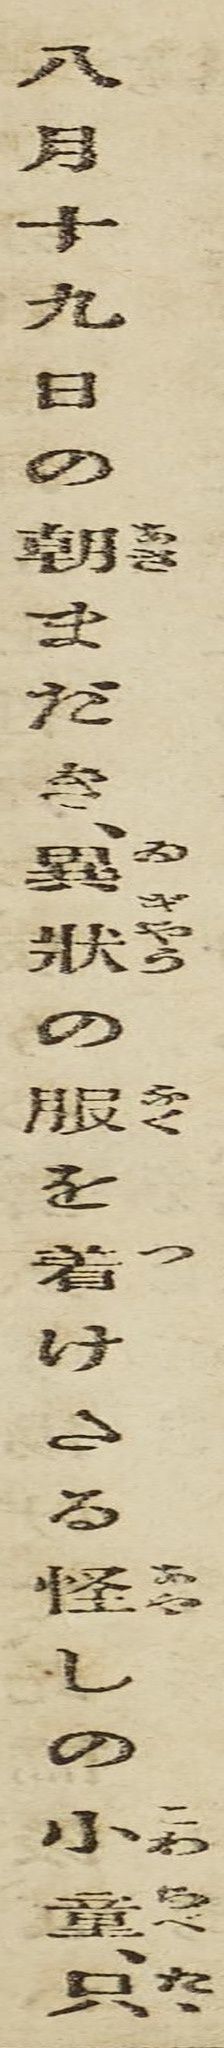八月十九日の朝まだき、異状の服を着けたる怪しの小童、只

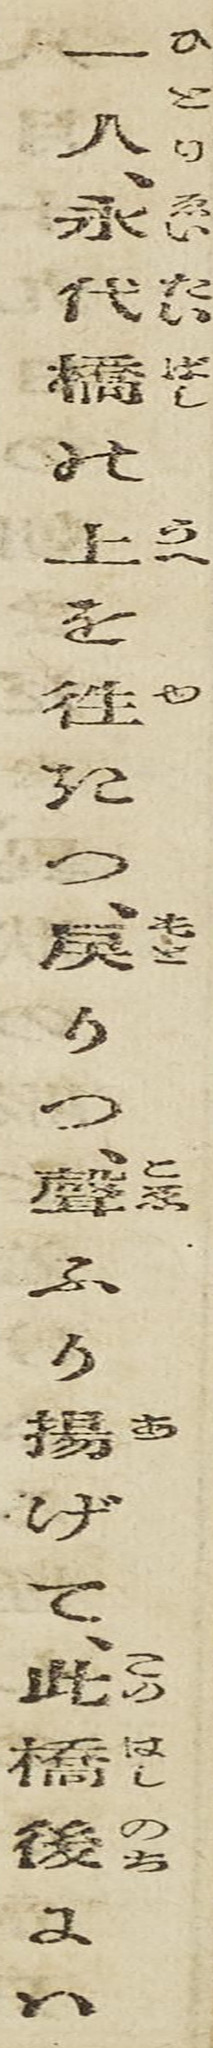一人、永代橋の上を往きつ、戻りつ、声ふり揚げて、此橋後には
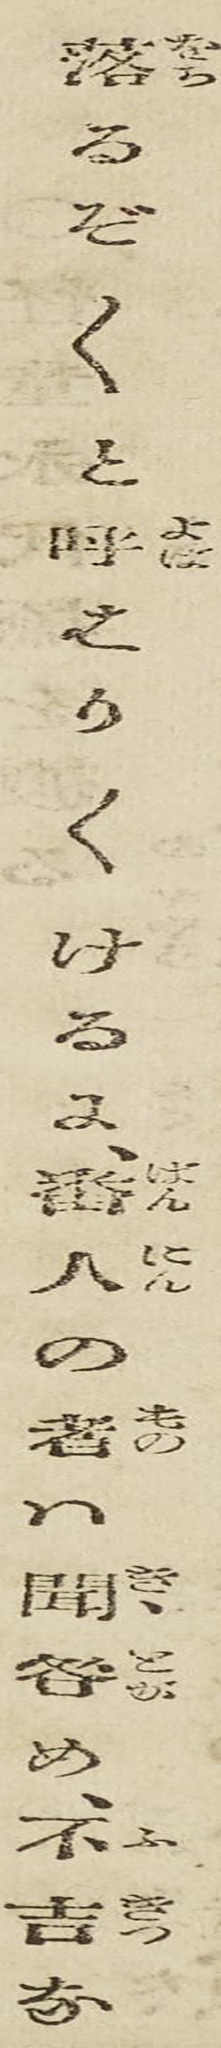落るぞ〳〵と呼はり〳〵けるに、番人の者は聞咎め、不吉な
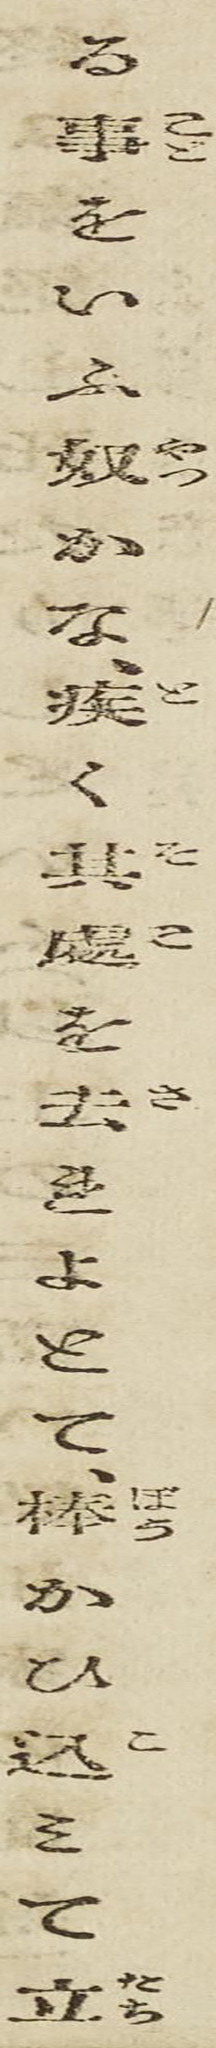る事をいふ奴かな、疾く其処を去れよとて、棒かひ込みて立
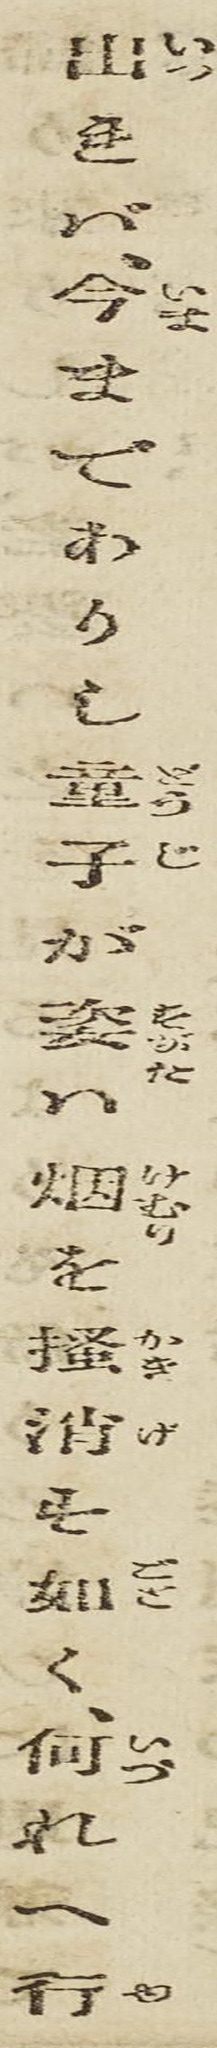出れば、今までありし童子が姿は煙を掻消す如く、何れへ行
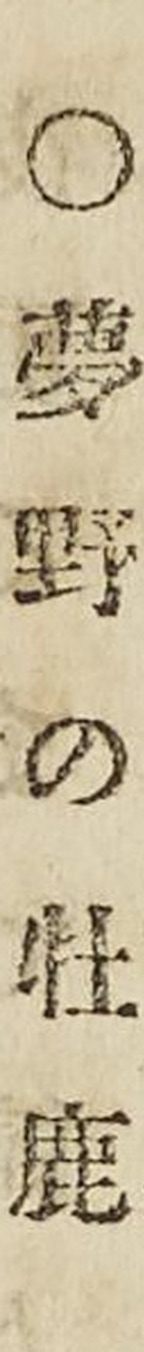○夢野の牡鹿
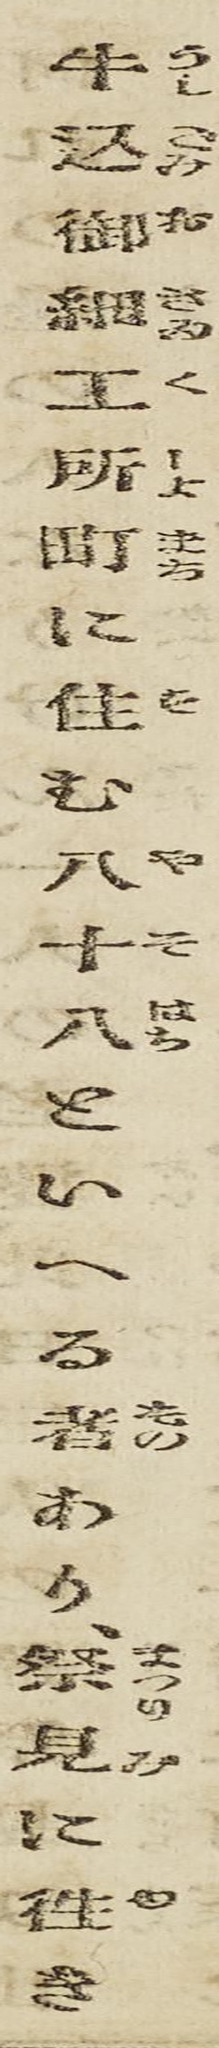牛込御細工所町に住む八十八といへる者あり、祭見に往き
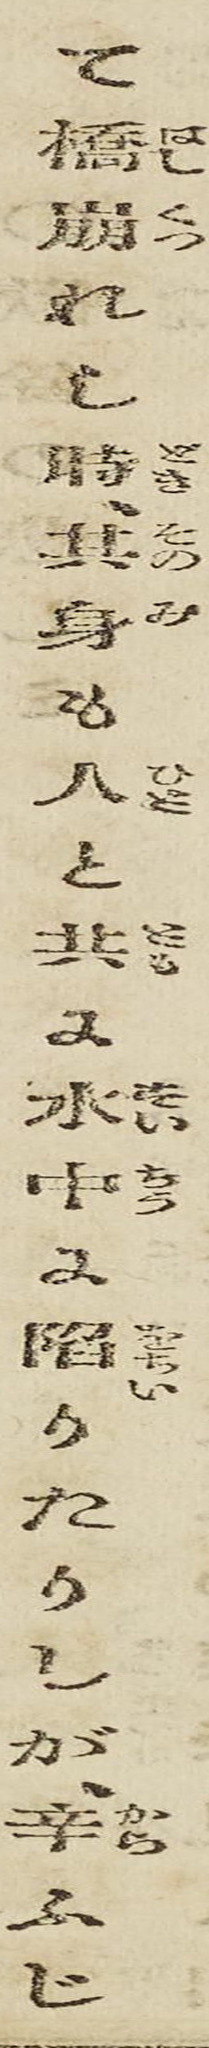て橋崩れし時、其身も人と共に水中に陥りたりしが、辛ふじ
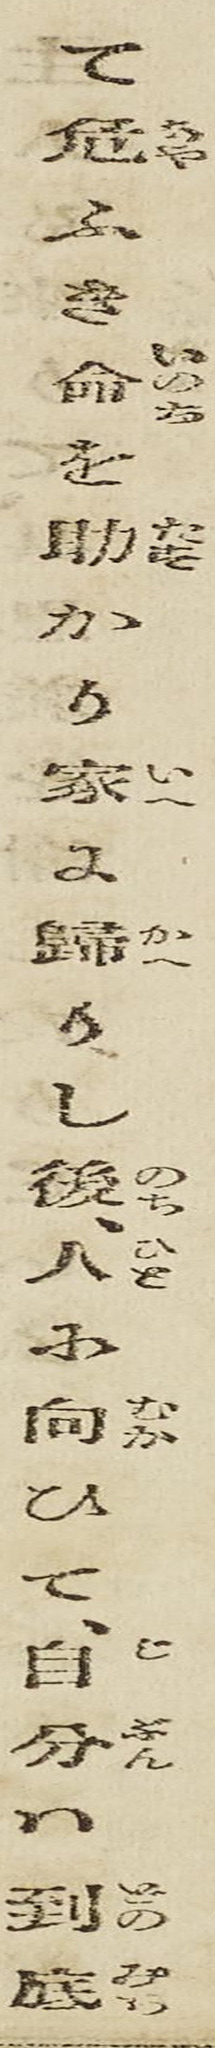て危ふき命を助かり家に帰りし後、人に向ひて、自分は到底
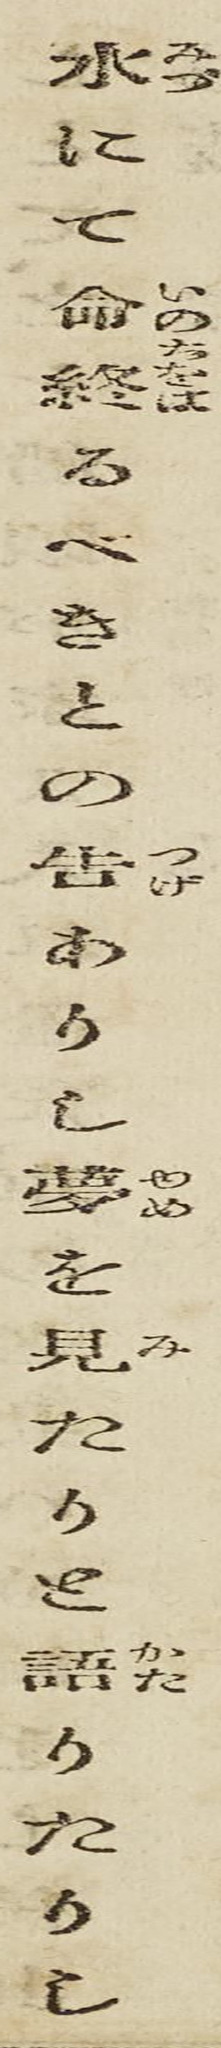水にて命終るべきとの告ありし夢を見たりと語りたりし
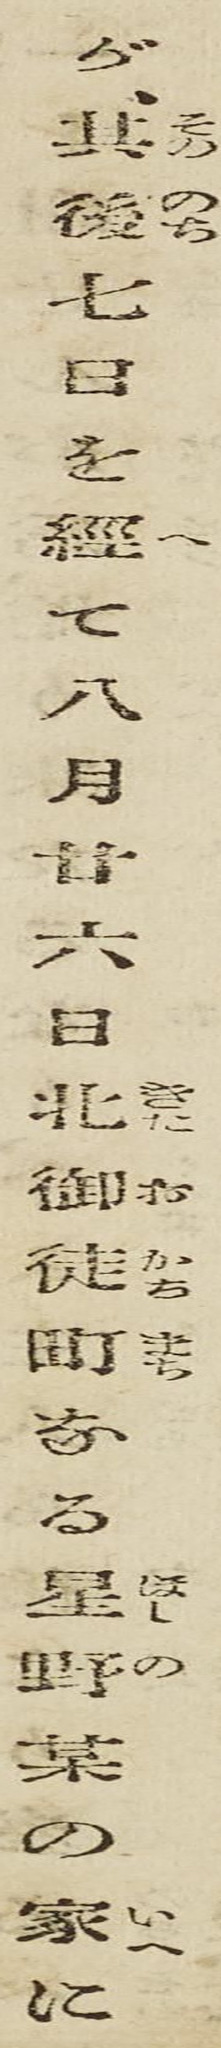が、其後七日を経て八月廿六日北御徒町なる星野某の家に
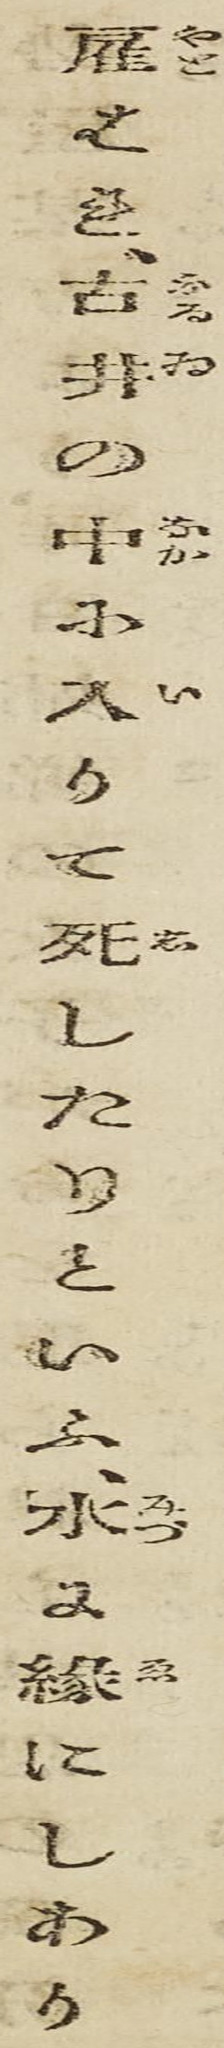雇はれ、古井の中に入りて死したりといふ、水に縁にしあり
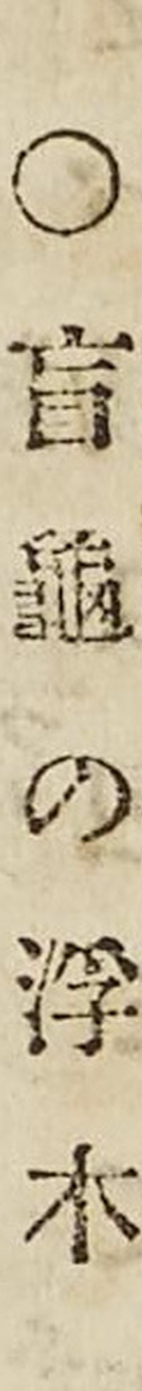○盲亀の浮木
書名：永代惨話　文化の夢　全
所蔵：東京大学地震研究所図書室 Earthquake Research Institute Library, The University of Tokyo, JAPAN
